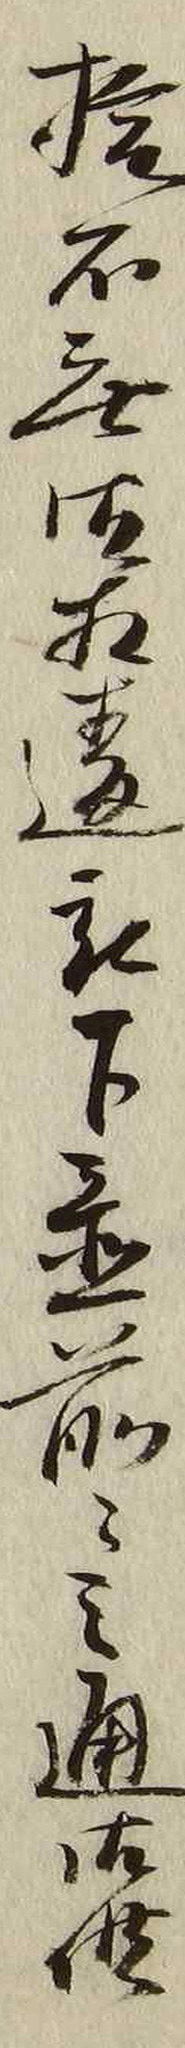拾石無御相違被下置前々之通御供
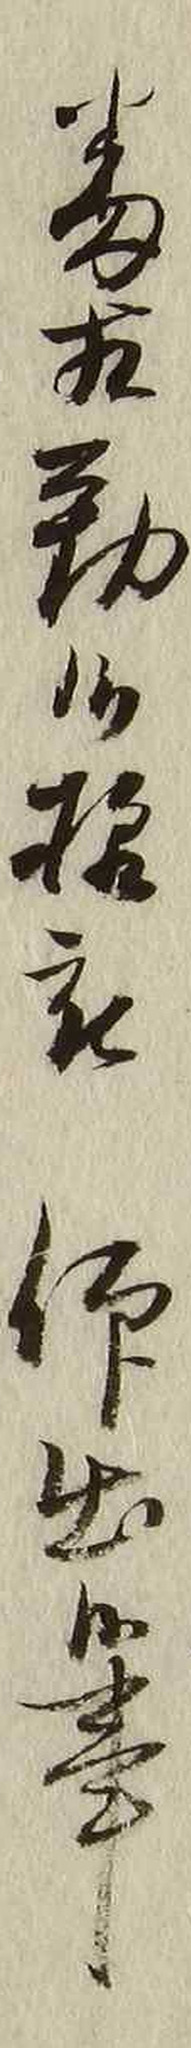番相勤候様被仰出候事
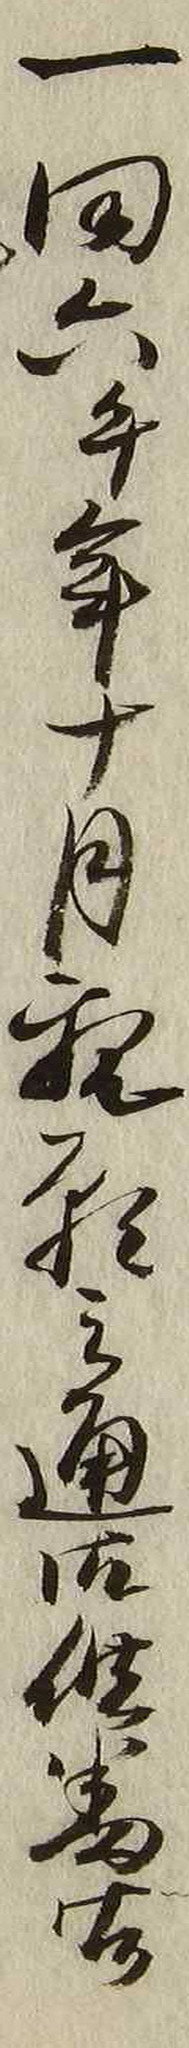一同六午年十月親願之通御供番御
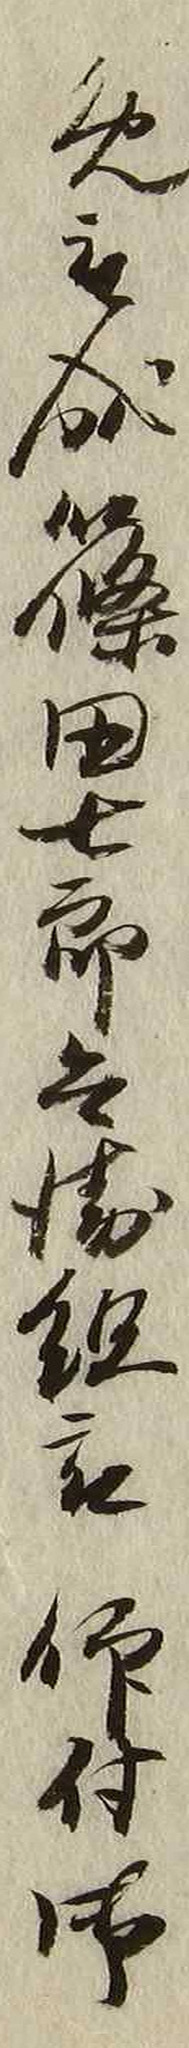免被成篠田七郎兵衛組被仰付御
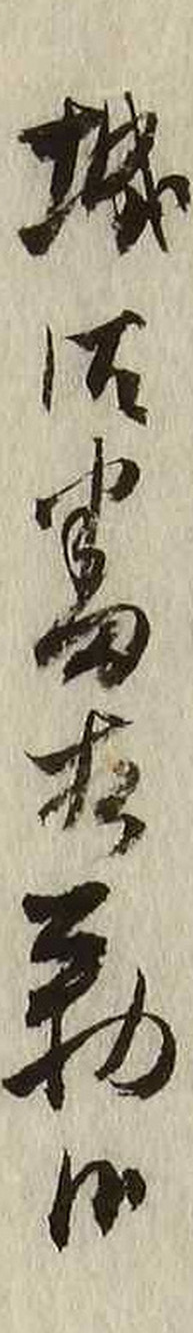城御番相勤候
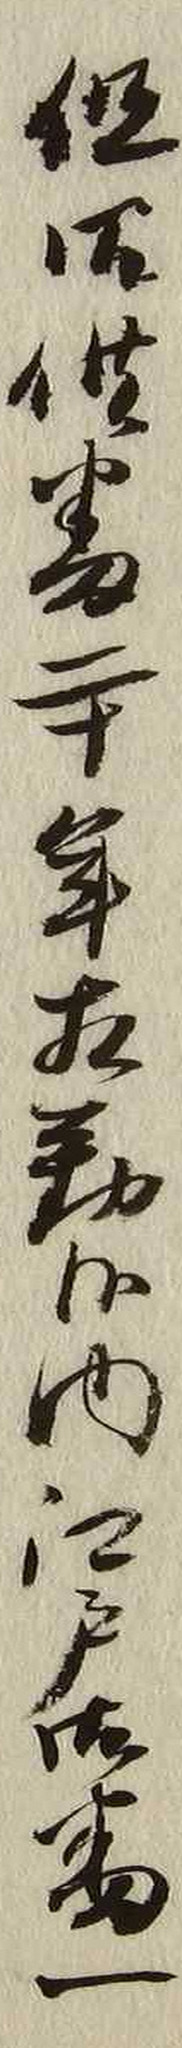但御供番二十年相勤候内江戸御番一
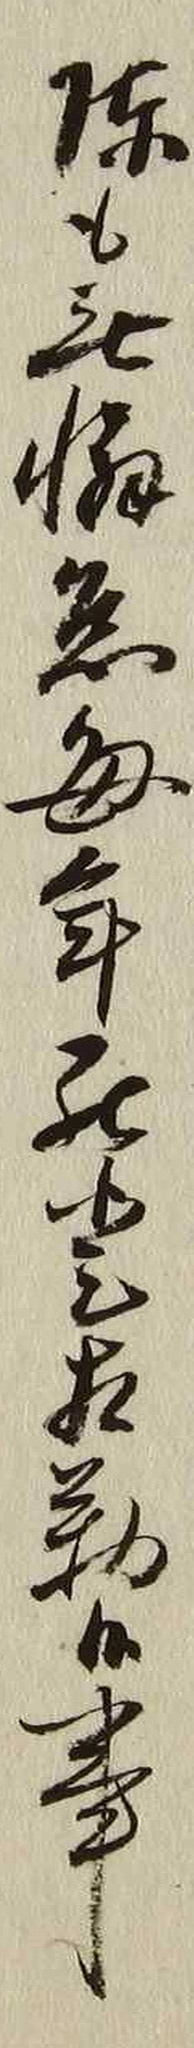陣も無懈怠毎年罷登相勤候事
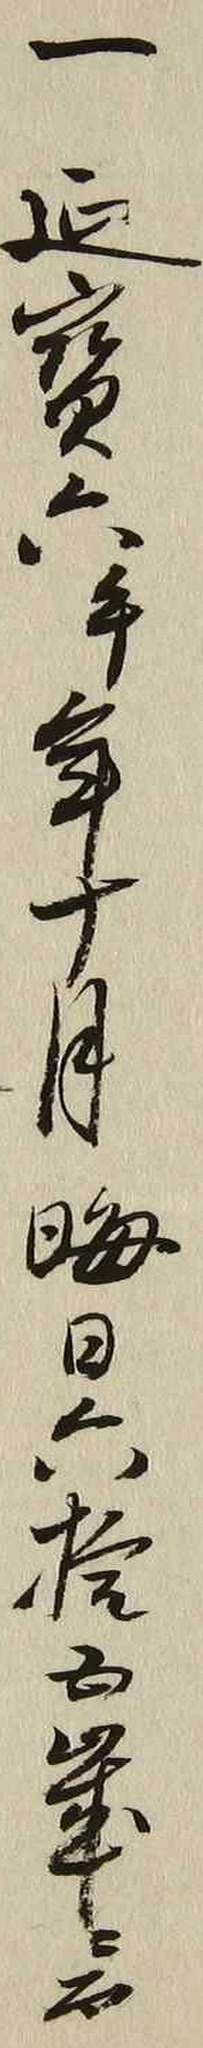一延宝六午年十月晦日六拾五歳ニ而
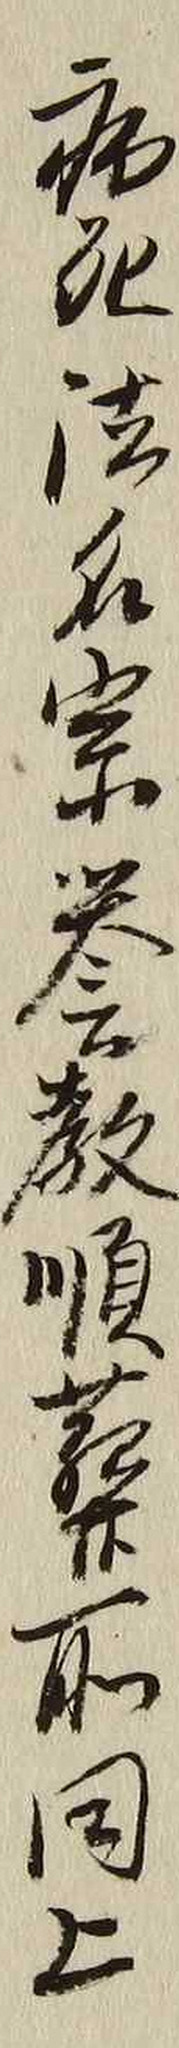病死法名宗誉教順葬所同上
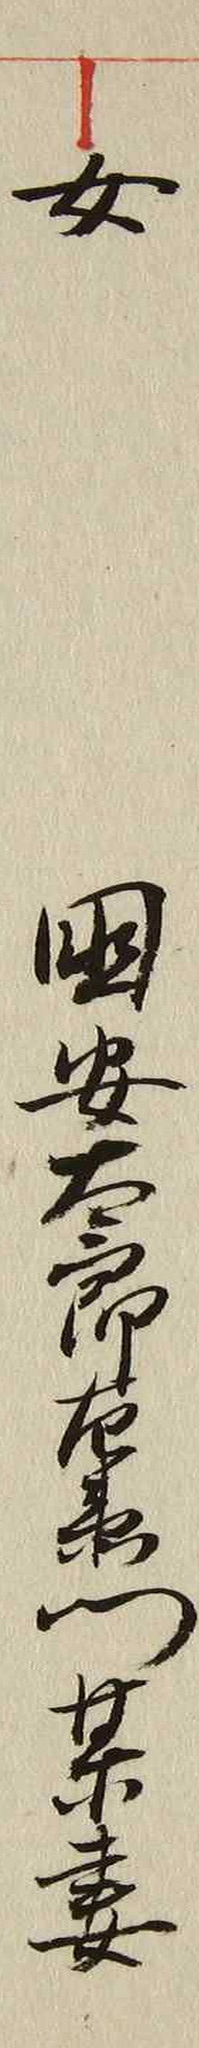女国安太郎左衛門某妻
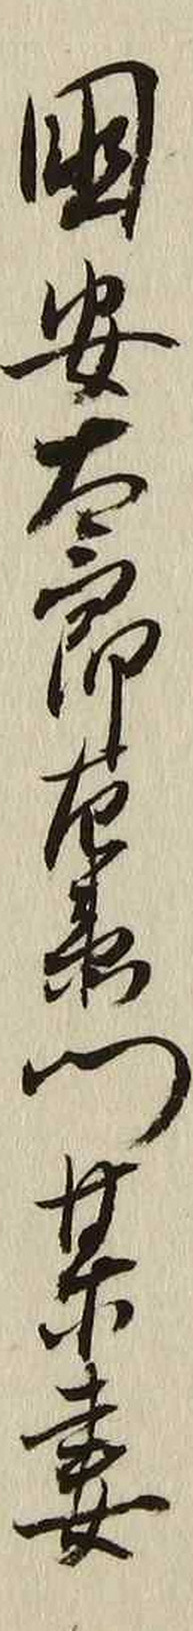女国安太郎左衛門某妻
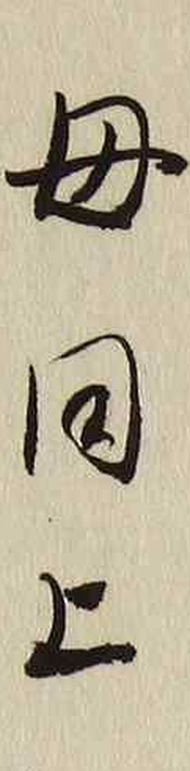母同上
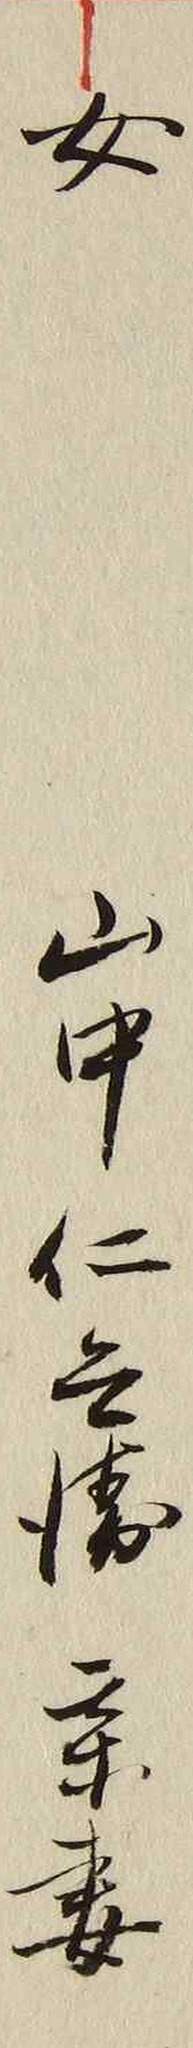女山中仁兵衛某妻
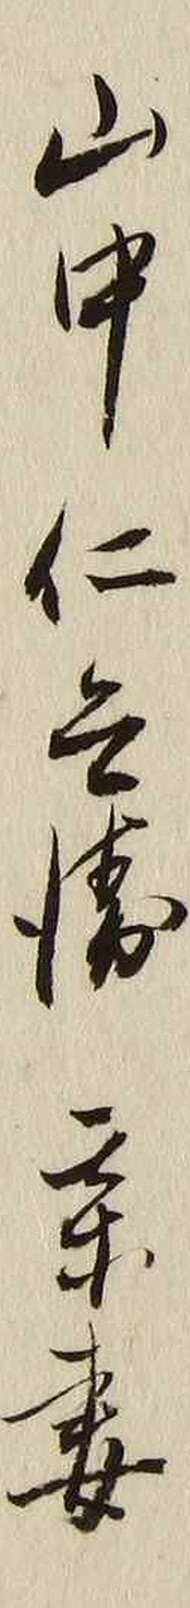女山中仁兵衛某妻
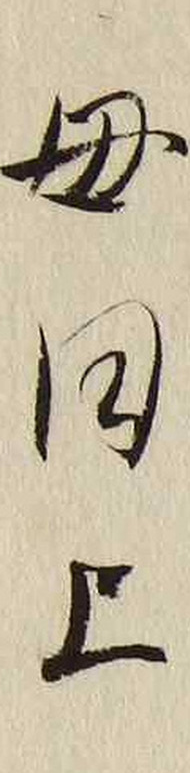母同上

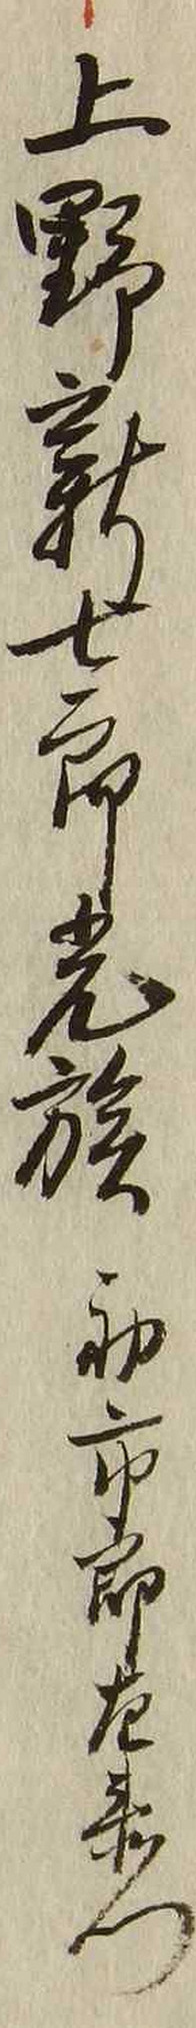上野新七郎光族初市郎左衛門
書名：諸士系譜　巻之356　す之部6
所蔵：会津若松市立会津図書館
